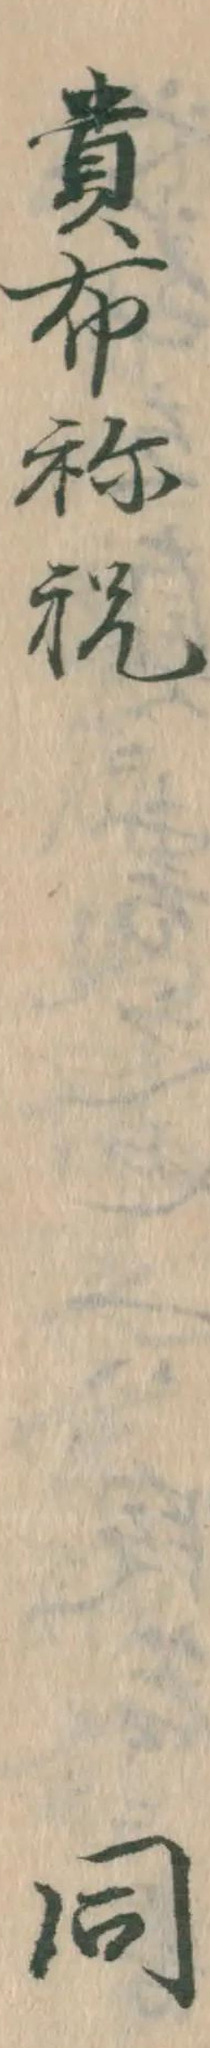貴布禰祝同
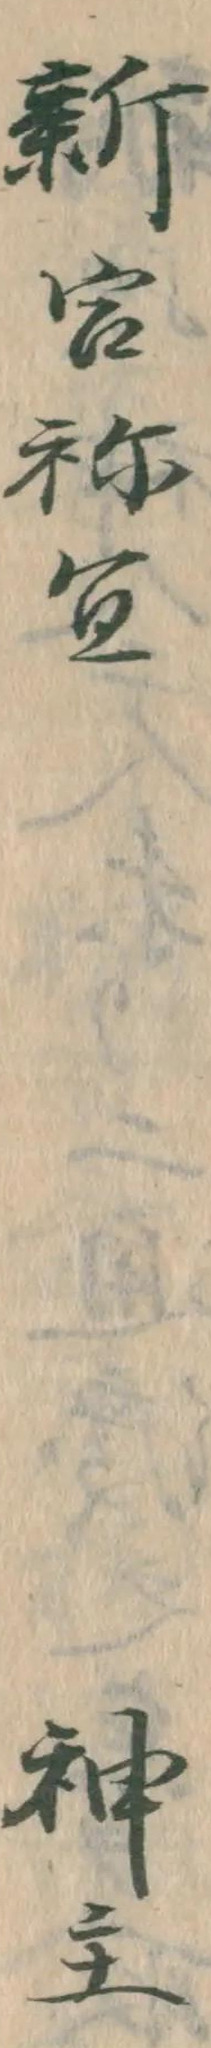新宮禰宜神主

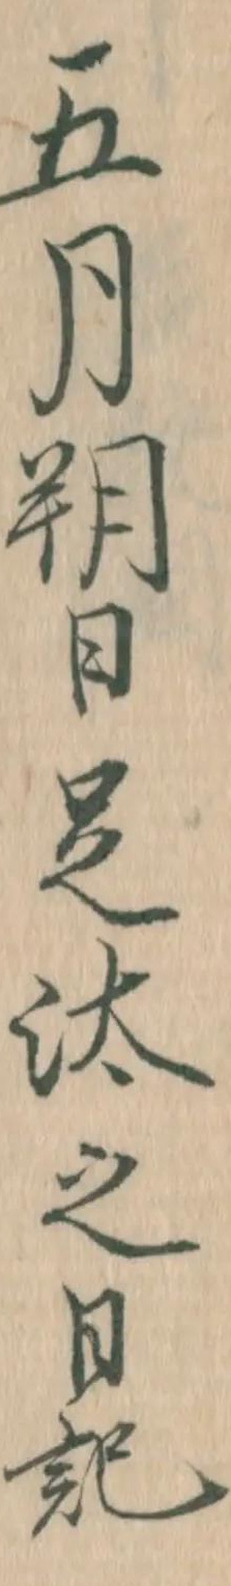五月朔日足汰之日記
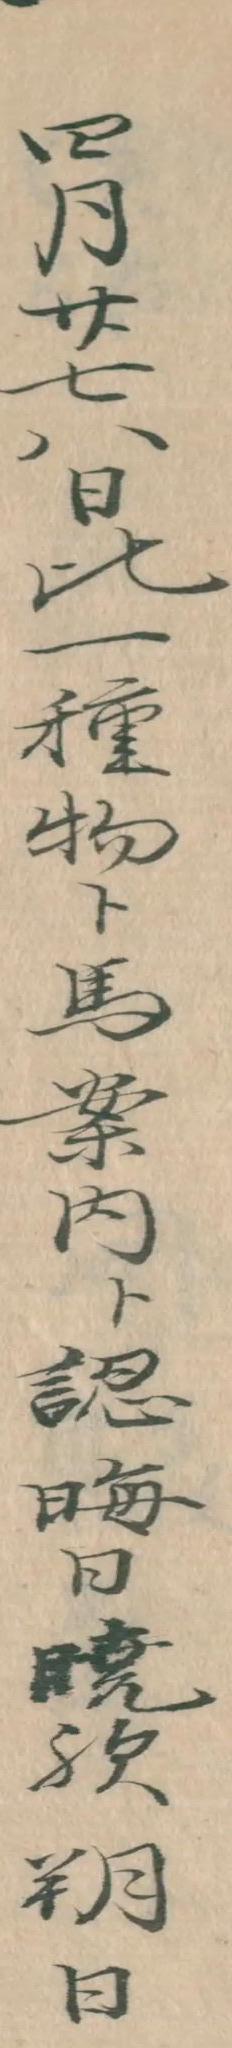一四月廿七八日比一種物ト馬案内ト認晦日暁歟朔日
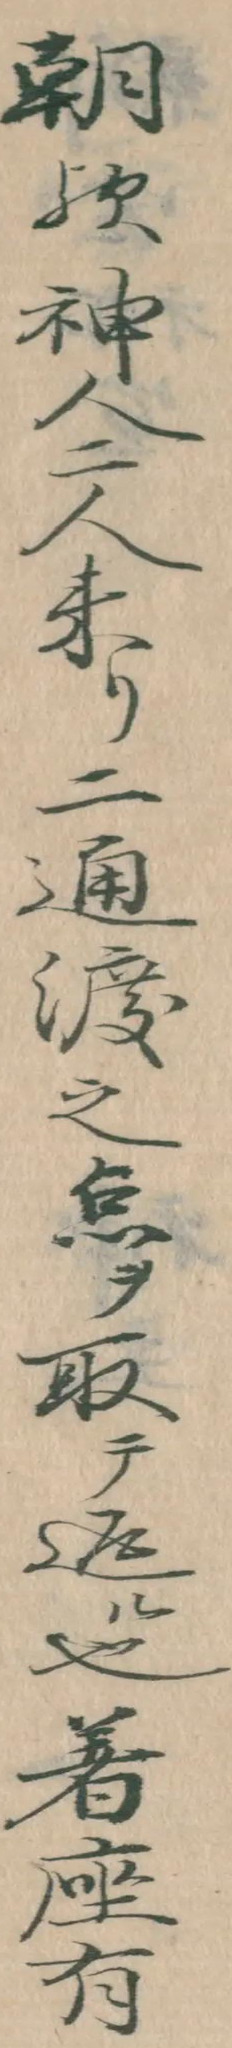朝歟神人二人来リ二通渡之点ヲ取テ返ル也着座有
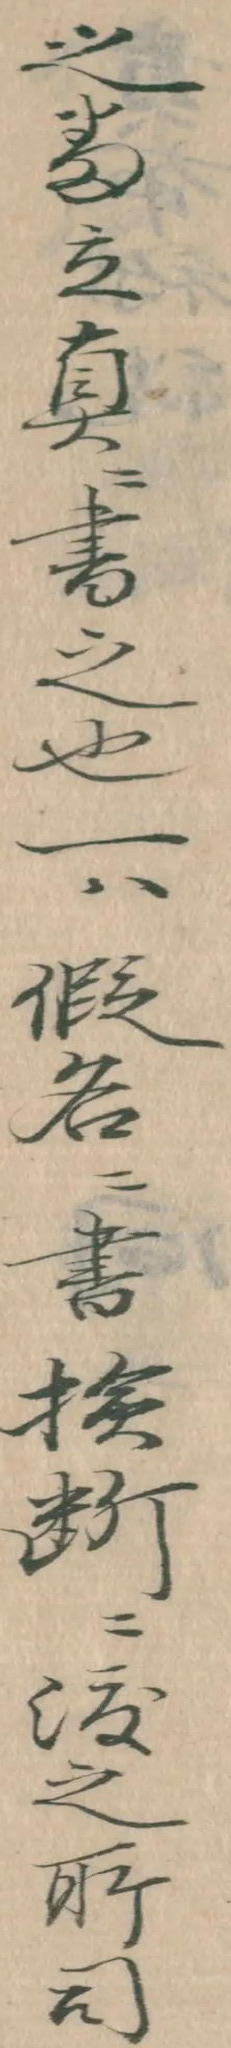之番立真ニ書之也一ハ仮名ニ書検断ニ渡之所司
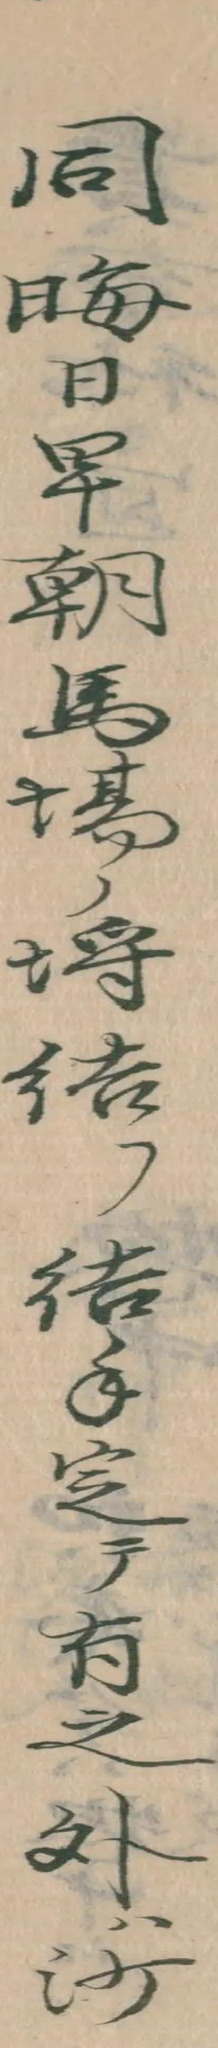一同晦日早朝馬場ノ埒結フ結手定テ有之外ハ沙
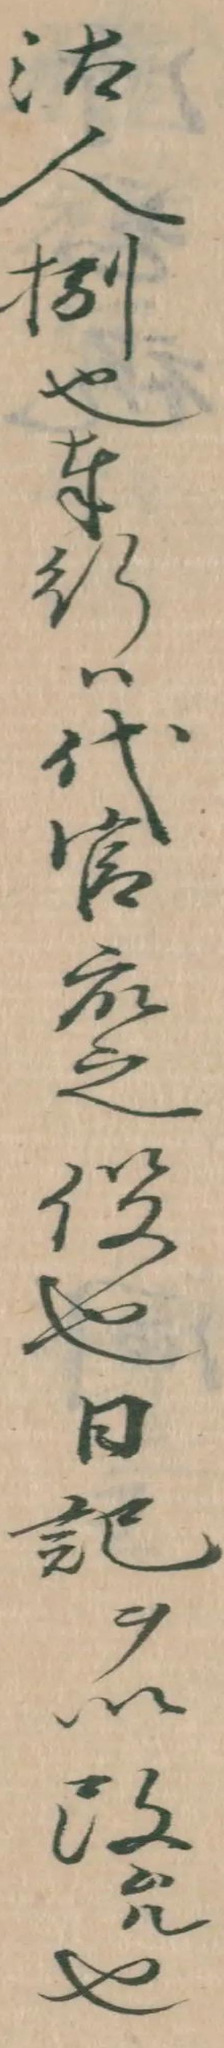汰人捌也奉行ハ代官衆之役也日記ヲ以改ムル也
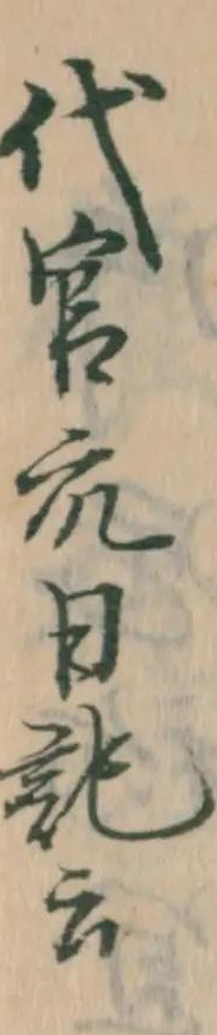代官衆日記云
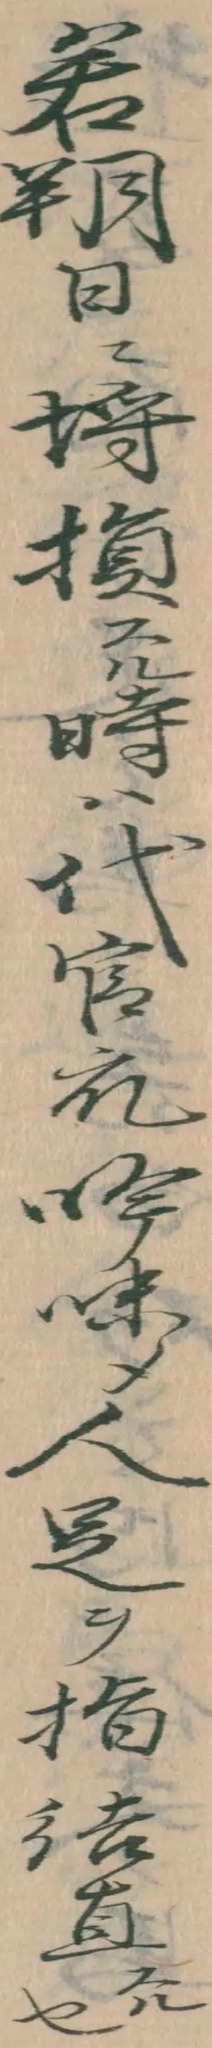若朔日ニ埒損スル時ハ代官衆吟味シテ人足ヲ指結直スル也
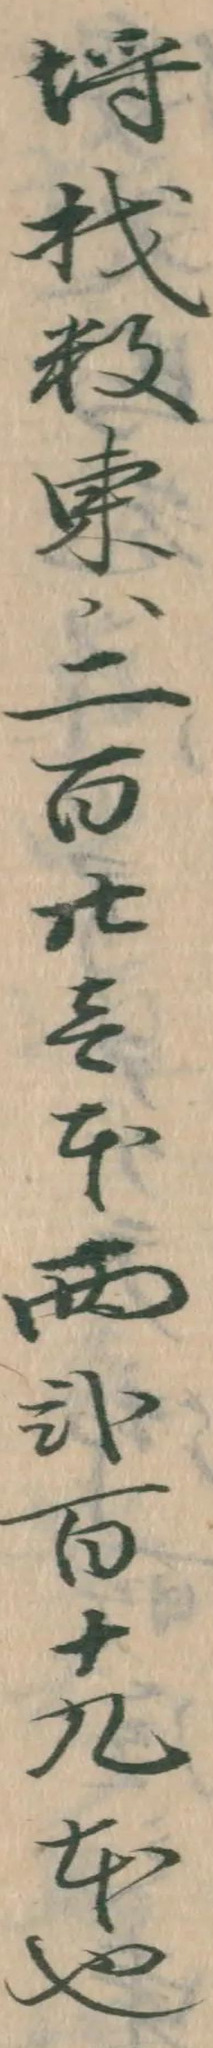埒杙数東ハ二百廿壱本西弐百十九本也
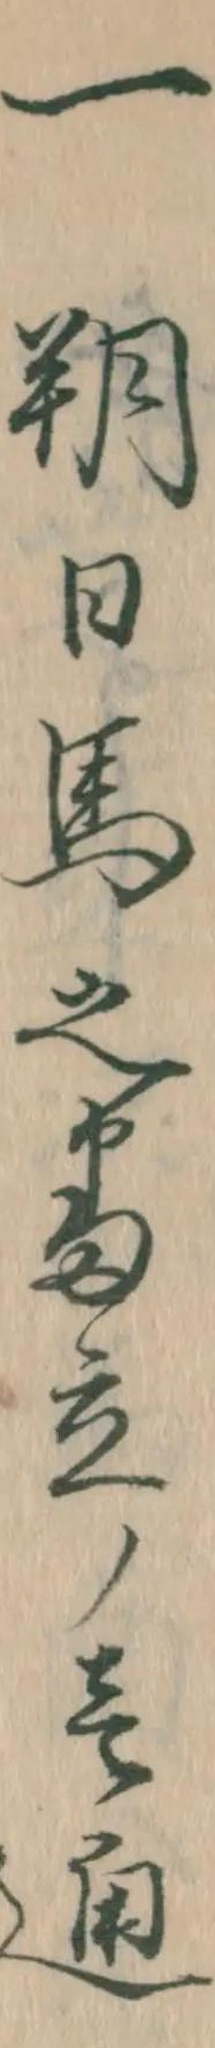一朔日馬之番立ノ壱通
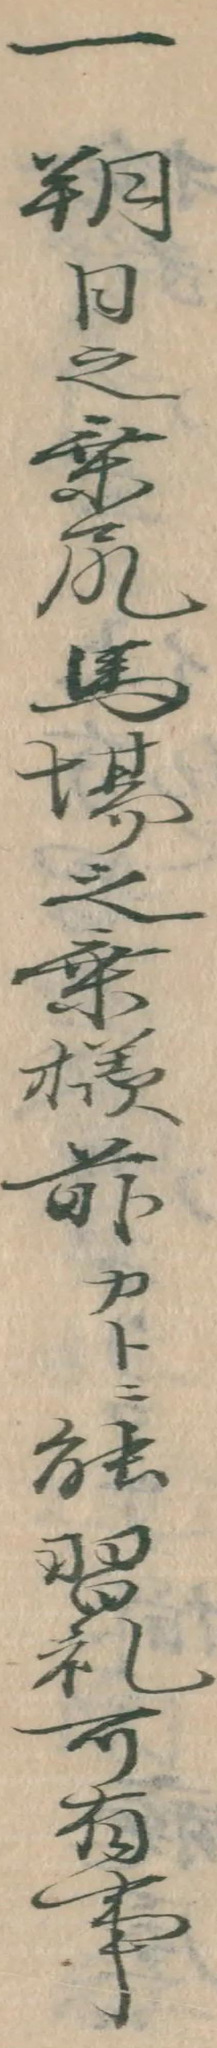一朔日之乗尻馬場之乗様前カトニ能習礼可有事
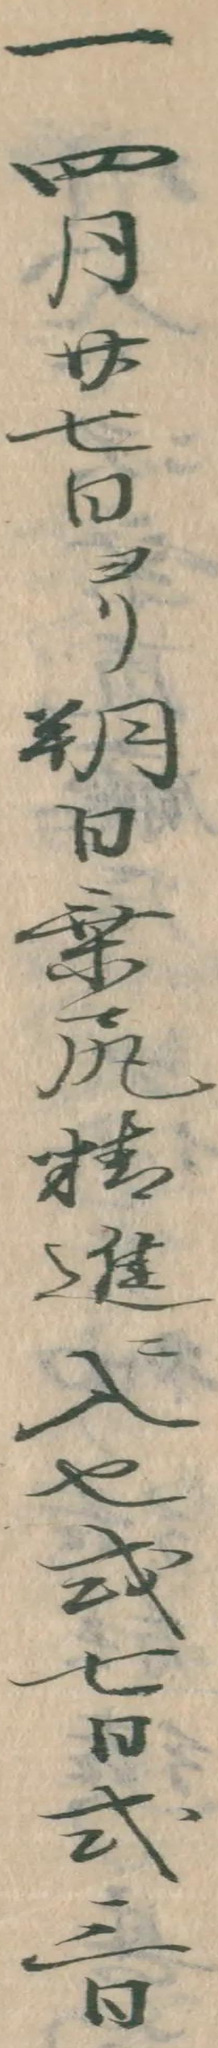一四月廿七日ヨリ朔日乗尻精進ニ入也或七日式三日
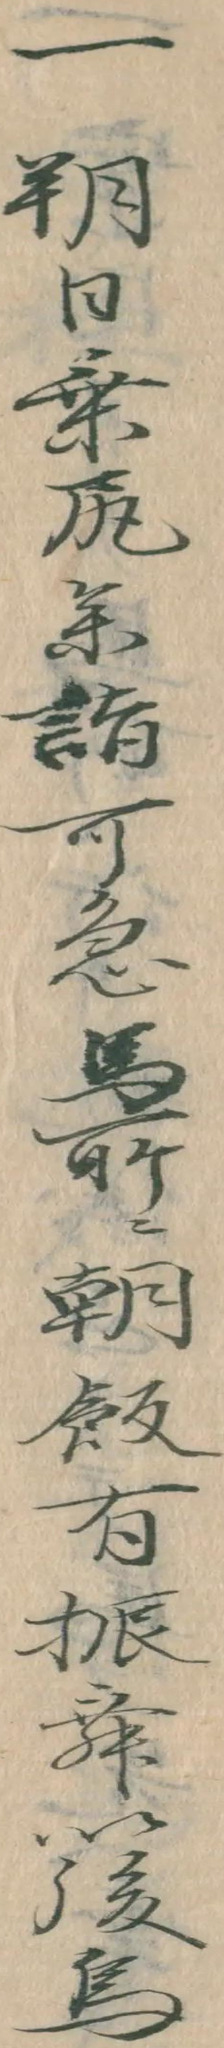一朔日乗尻参詣可急馬所ニ朝飯有振舞以後烏
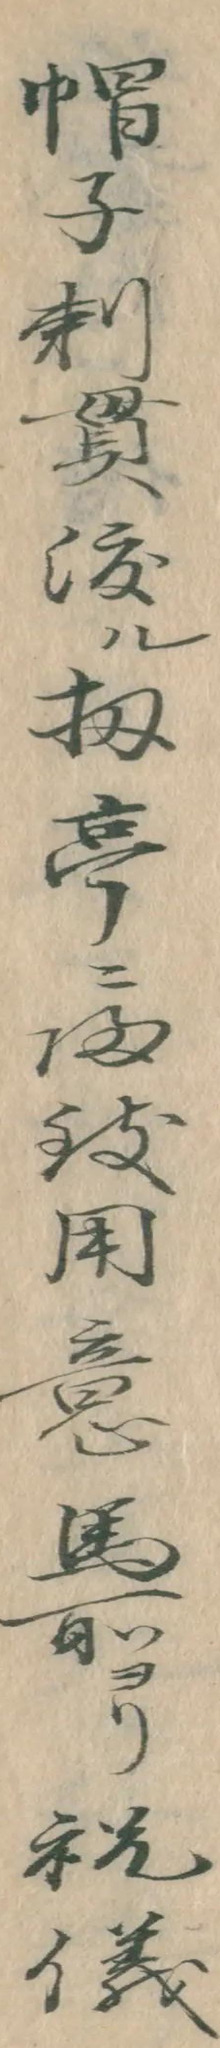帽子刺貫渡ル扨亭ニ帰致用意馬所ヨリ祝儀
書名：賀茂社記録. 第11冊
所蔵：国立国会図書館 National Diet Library, JAPAN
